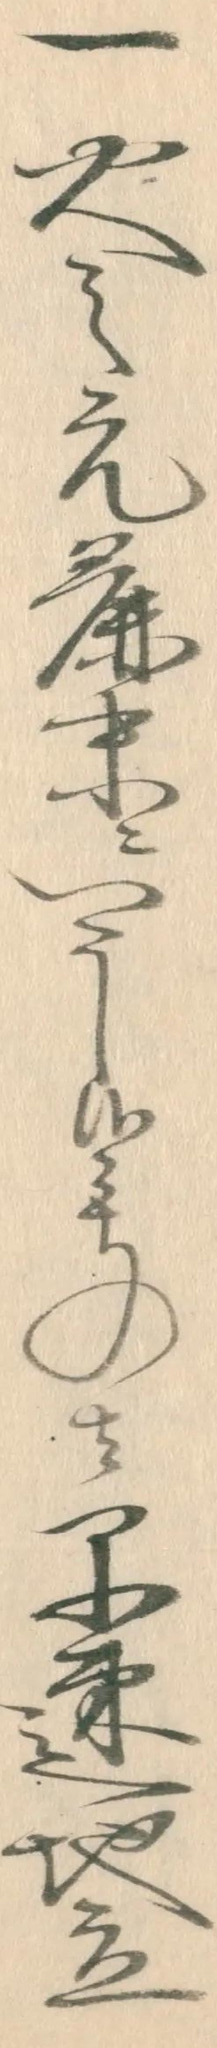一火之元麁末ニいたし候ものは早速地立
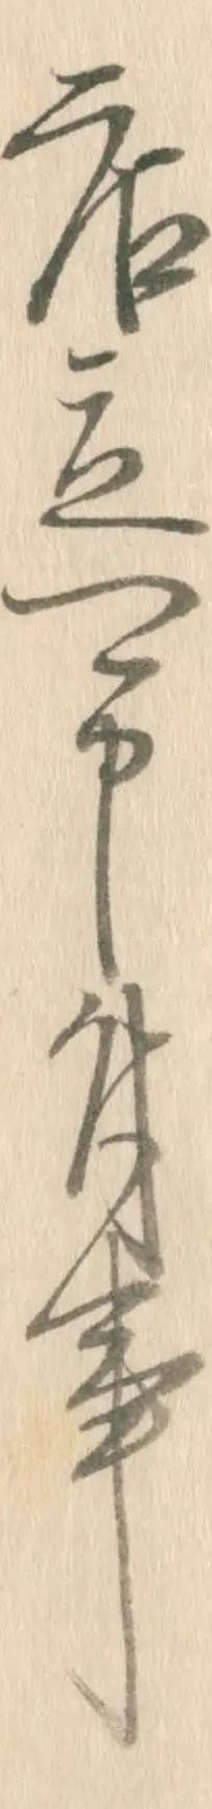店立可申付事

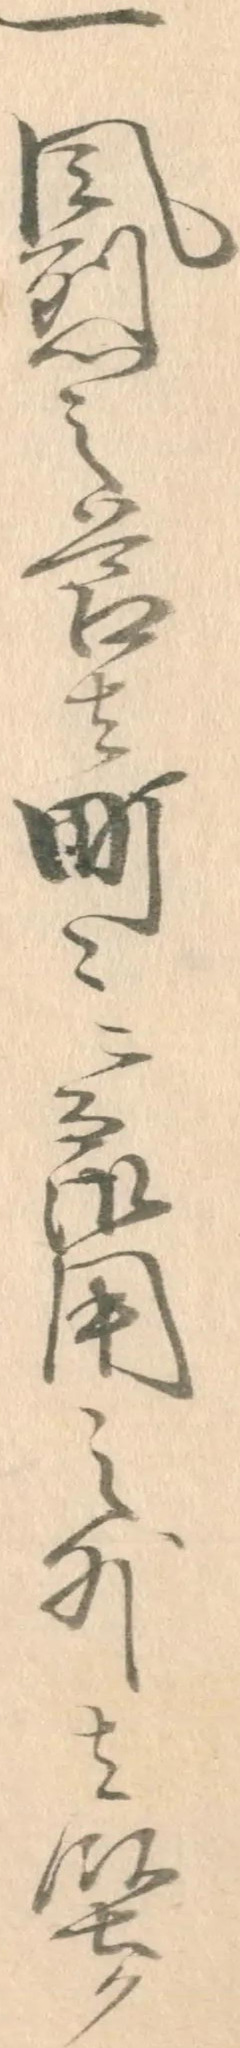一風烈之節は町々ニ而御用之外は堅ク
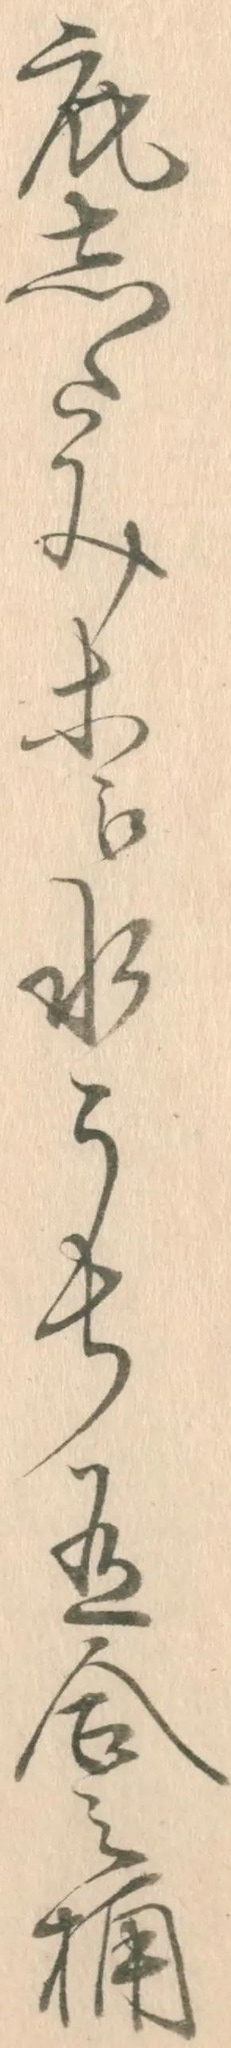庇したみ等え水うち有合之桶
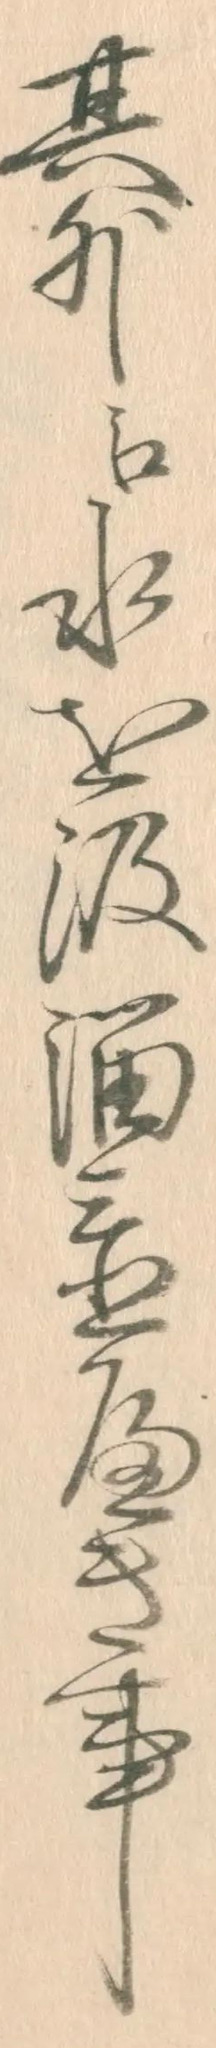其外え水を汲溜置へき事
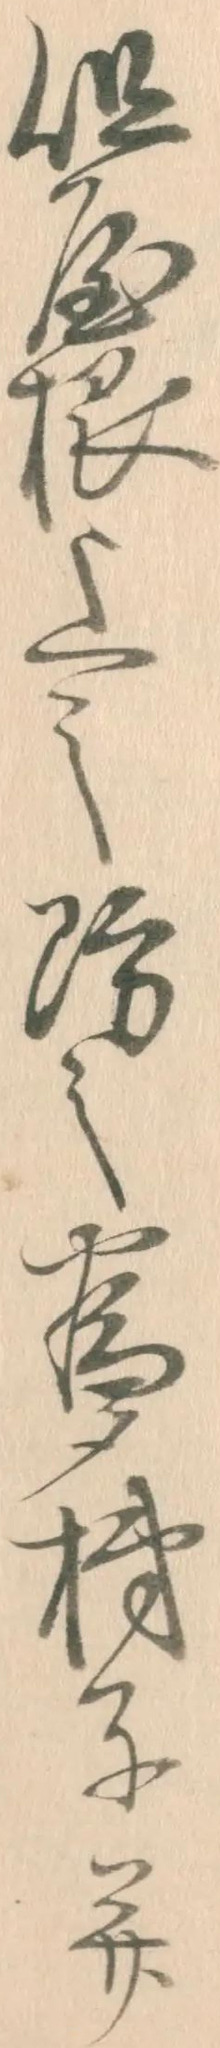但屋根上之防之為メ梯子并
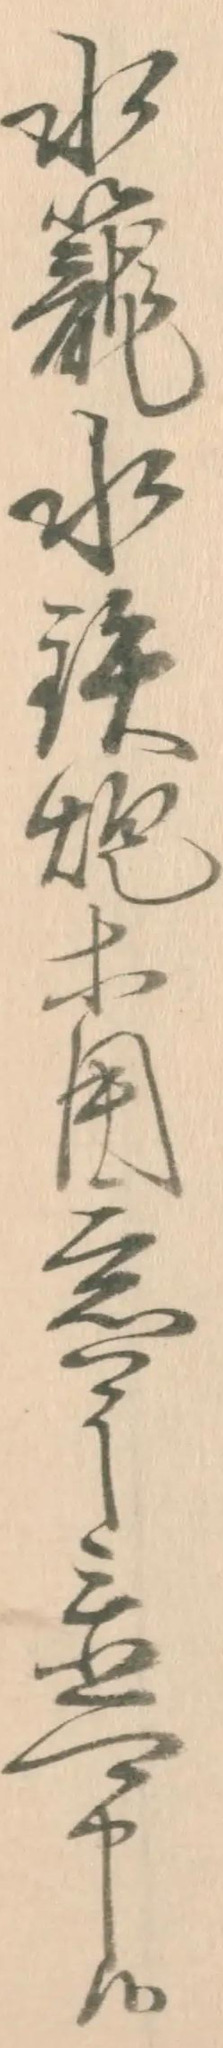水籠水鉄砲等用意いたし置可申候
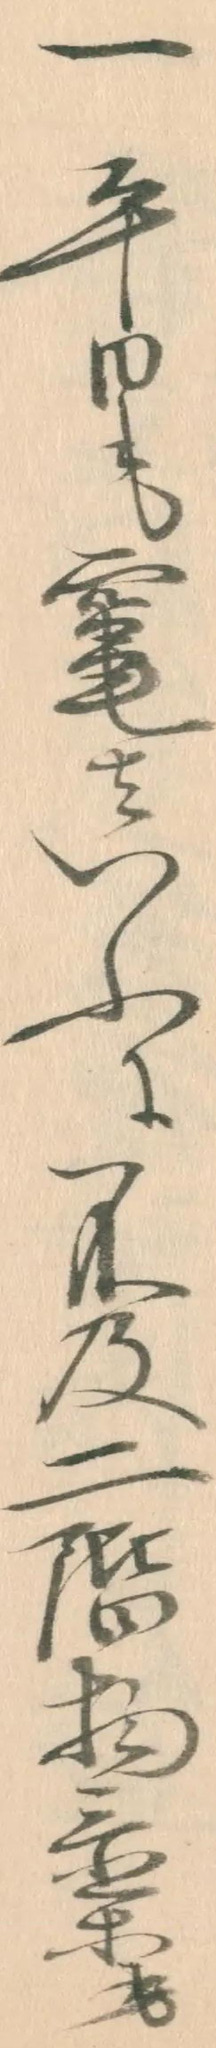一平日も竈はいふに不及二階物置等も
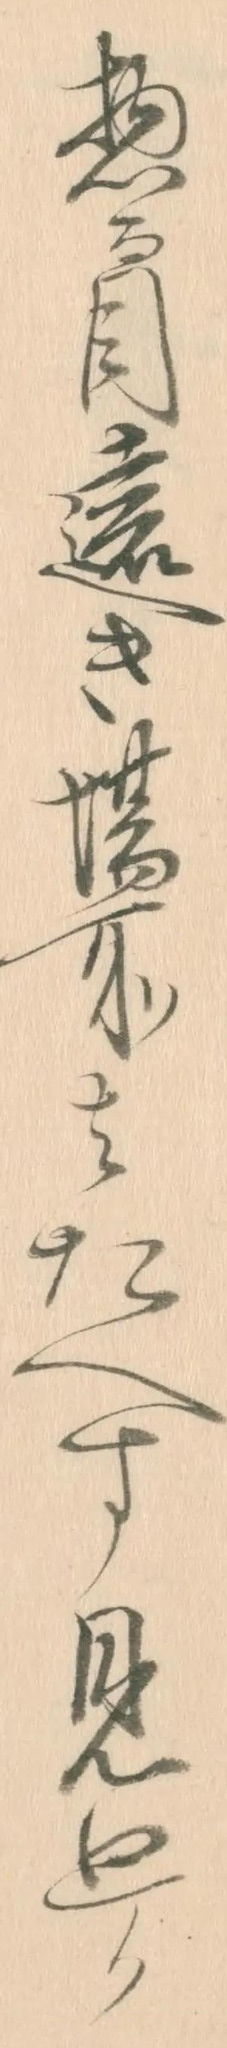惣而目遠き場所はたへす見廻り
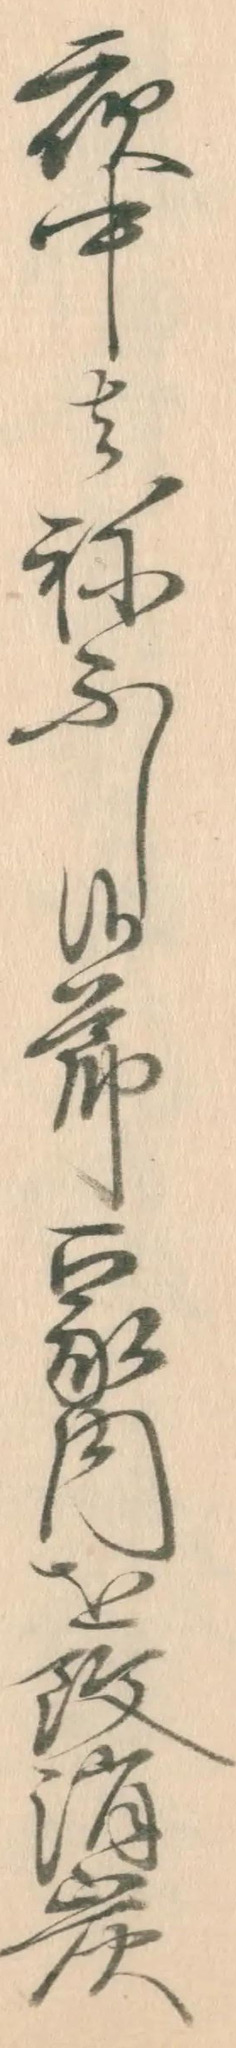夜中はねふし候節家内を改消炭
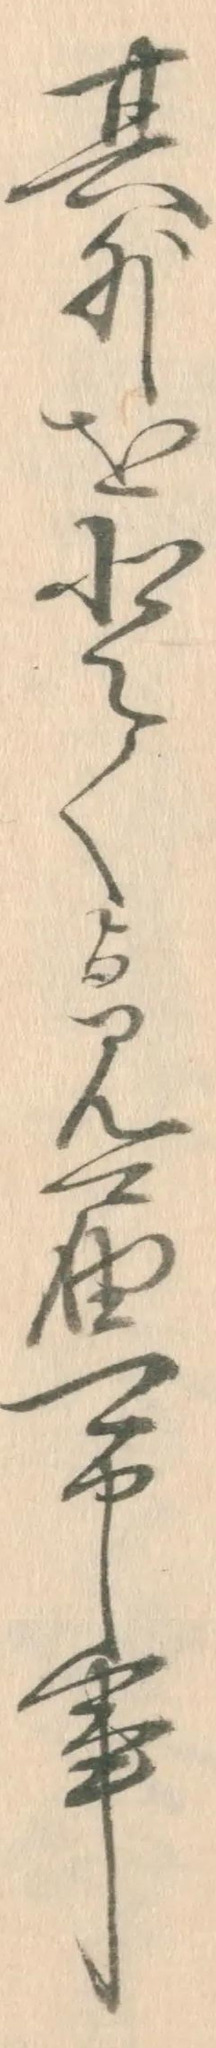其外をとくと見届可申事
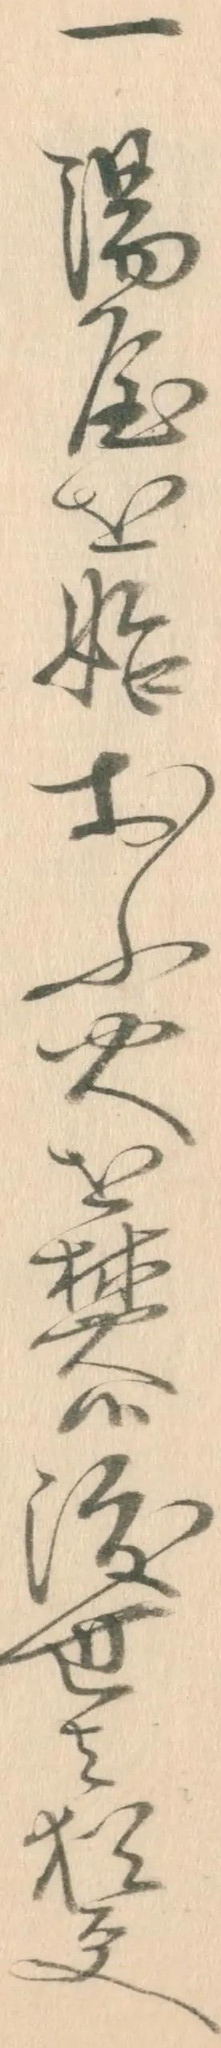一湯屋を始おふ火を焚候渡世は猶更
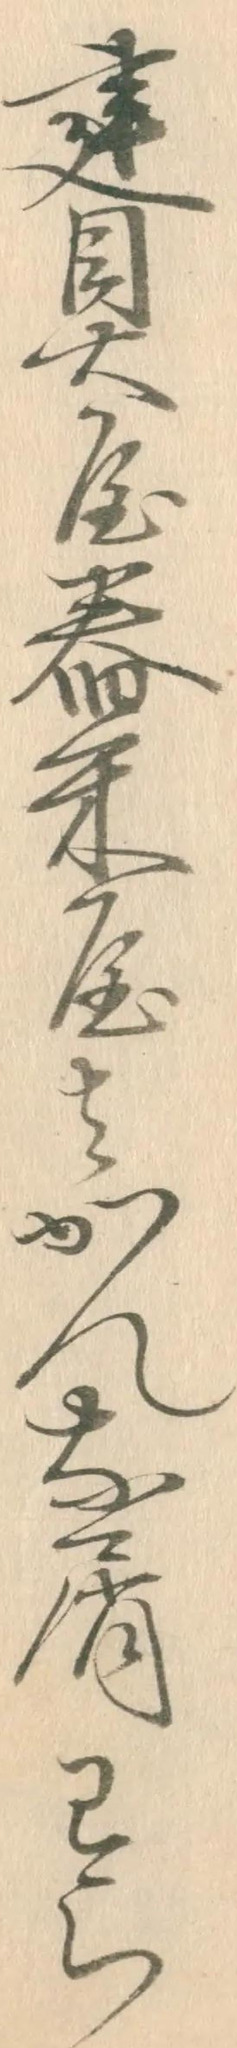建具屋舂米屋はかんな屑わら

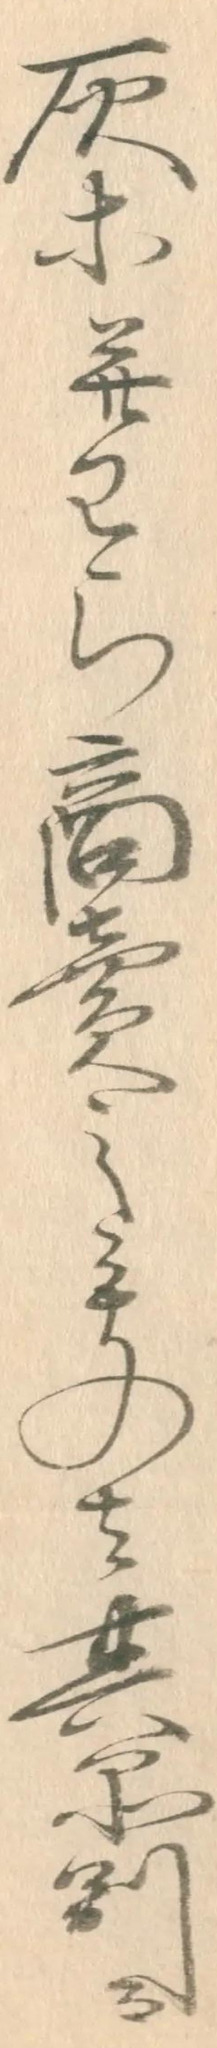灰等并わら商売之ものは其品別而
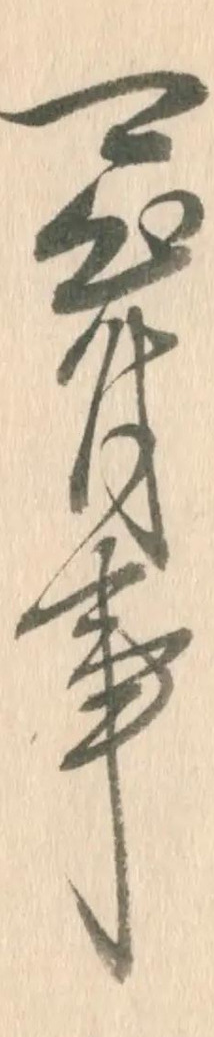可心付事
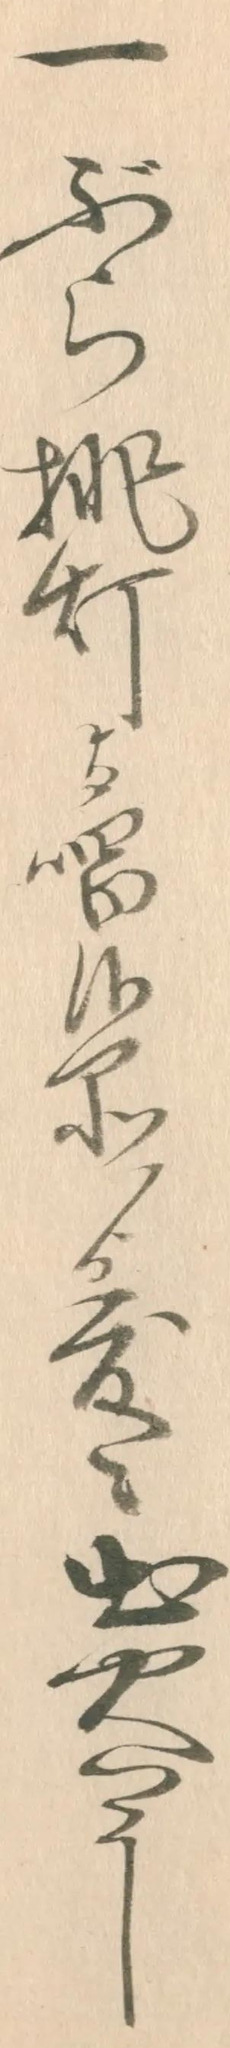一ぶら挑灯と唱候品ゟ度々出火いたし
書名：三橋 17巻. [7] 三橋小破御修復書留　但御奉行御掛リ替地震潰橋番屋　嘉永四亥年より安政二卯年迄　上
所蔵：国立国会図書館 National Diet Library, JAPAN
